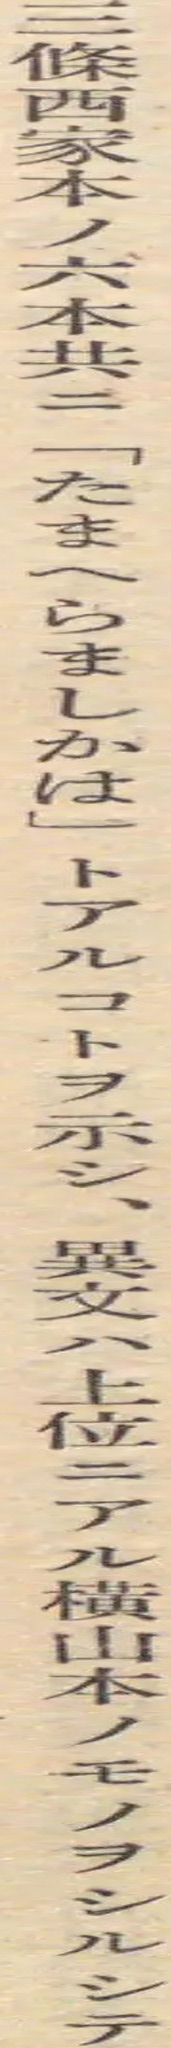三条西家本ノ六本共ニ「たまへらましかは」トアルコトヲ示シ、異文ハ上位ニアル横山本ノモノヲシルシテ
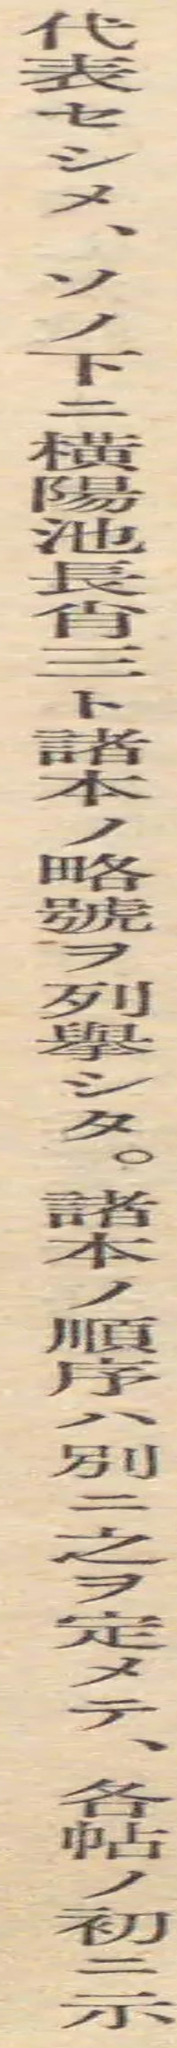代表セシメ、ソノ下ニ横陽池長肖三ト諸本ノ略号ヲ列挙シタ。諸本ノ順序ハ別ニ之ヲ定メテ、各帖ノ初ニ示
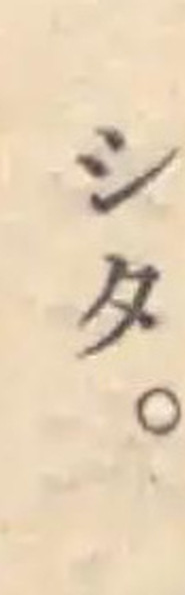シタ。
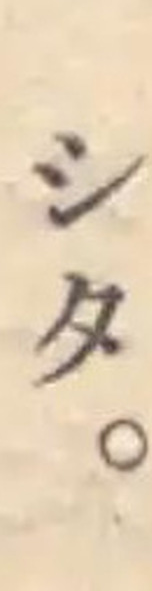シタ。
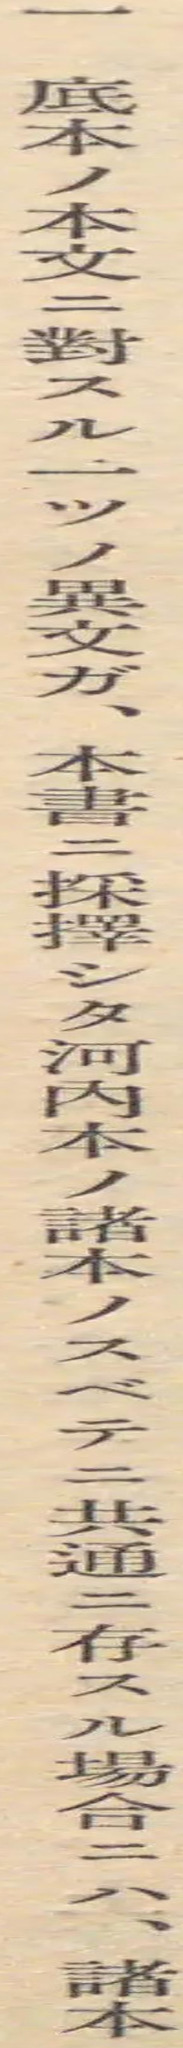一底本ノ本文ニ対スル一ツノ異文ガ、本書ニ採択シタ河内本ノ諸本ノスべテニ共通ニ存スル場合ニハ、諸本
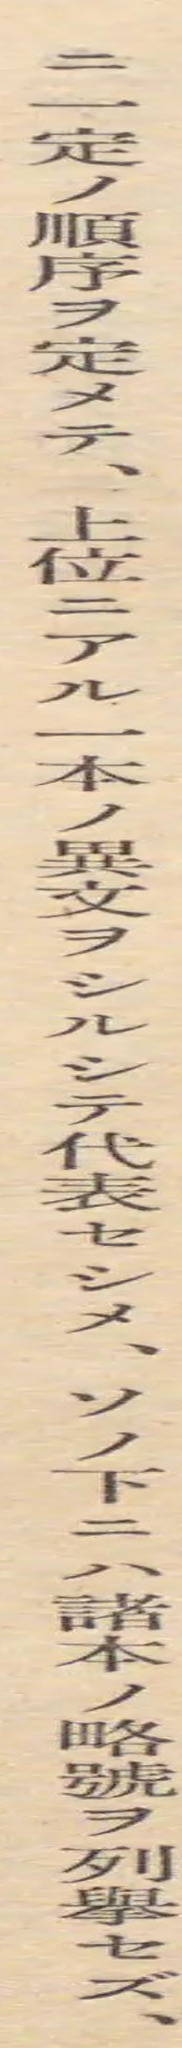ニ一定ノ順序ヲ定メテ、上位ニアル一本ノ異文ヲシルシテ代表セシメ、ソノ下ニハ諸本ノ略号ヲ列挙セズ、
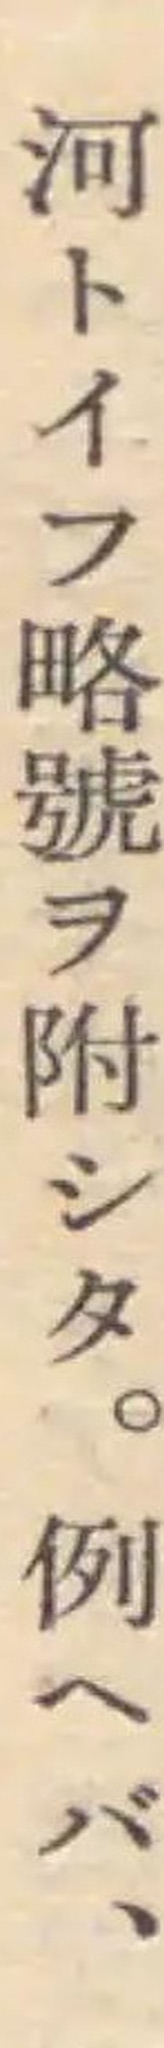河トイフ略号ヲ附シタ。例ヘバ、
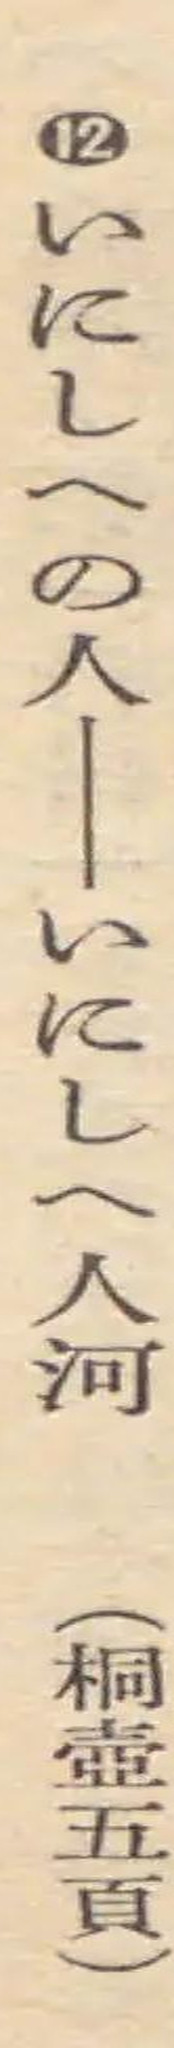⓬いにしへの人──いにしへ人河(桐壷五頁)
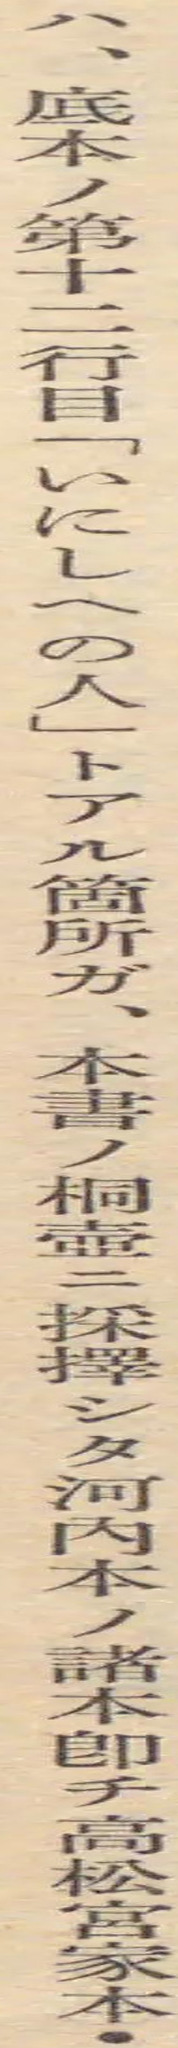ハ、底本ノ第十二行目「いにしへの人」トアル箇所ガ、本書ノ桐壷に採択シタ河内本ノ諸本即チ高松宮家本・
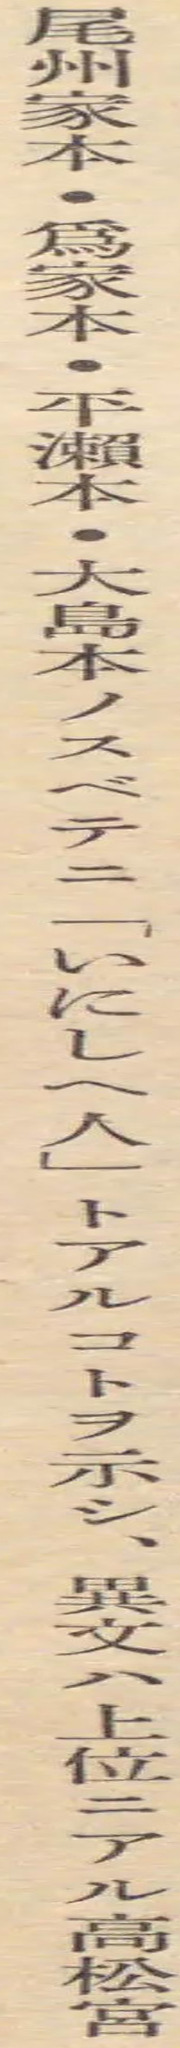尾州家本・為家本・平瀬本・大島本ノスべテニ「いにしへ人」トアルコトヲ示シ、異文ハ上位ニアル高松宮
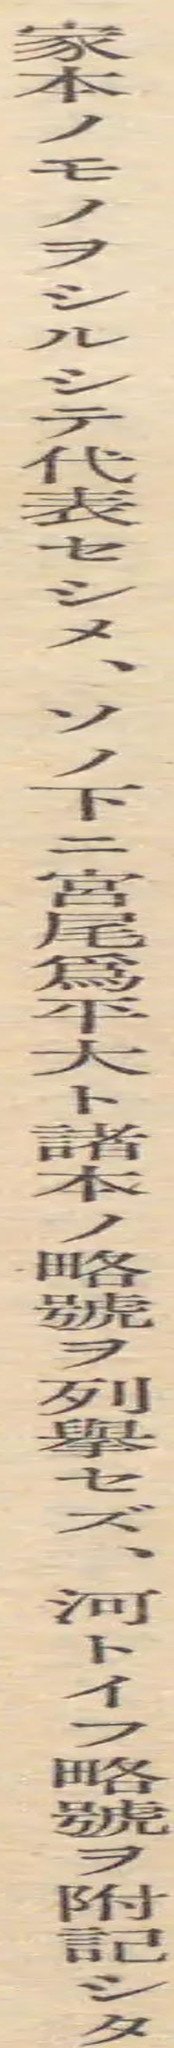家本ノモノヲシルシテ代表セシメ、ソノ下ニ宮尾為平大ト諸本ノ略号ヲ列挙セズ、河トイフ略号ヲ附記シタ。
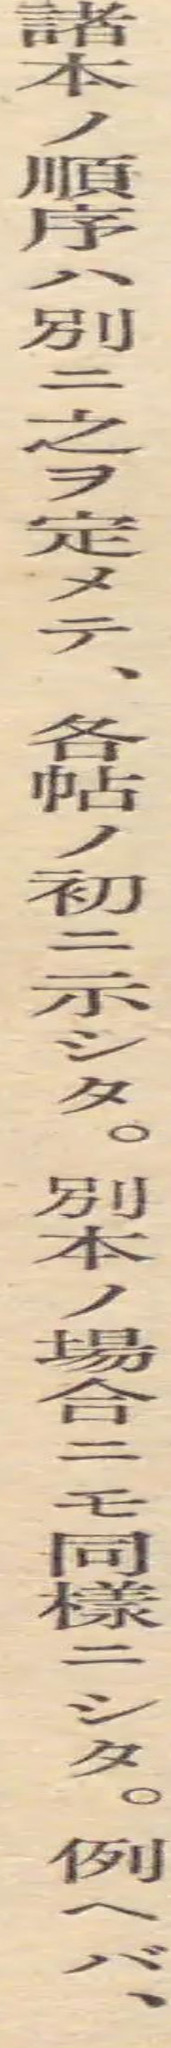諸本ノ順序ハ別ニ之ヲ定メテ、各帖ノ初ニ示シタ。別本ノ場合ニモ同様ニシタ。例ヘバ、
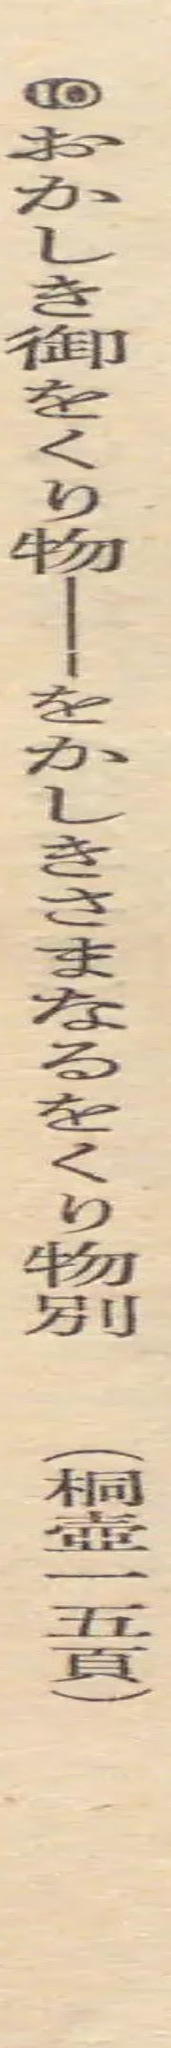➓おかしき御をくり物──をかしきさまなるをくり物別(桐壺一五頁)
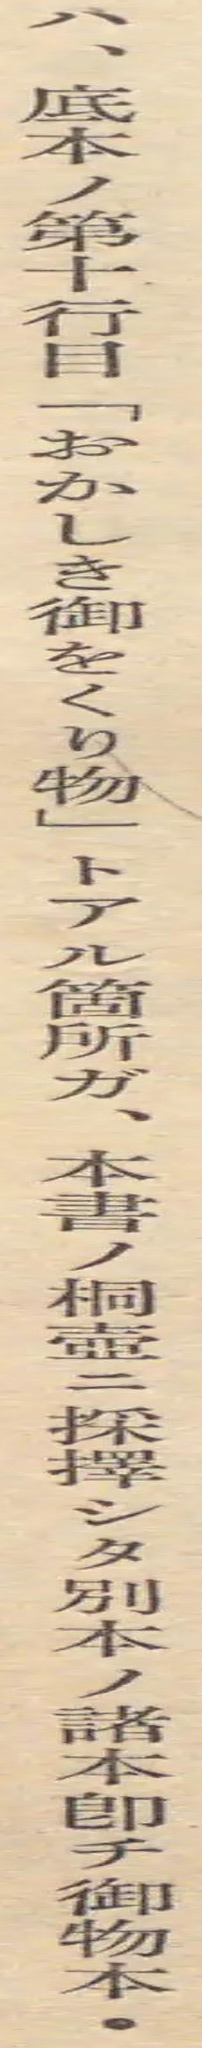ハ、底本ノ第十行目「おかしき御をくり物」トアル箇所ガ、本書ノ桐壺ニ採択シタ別本ノ諸本即チ御物本・
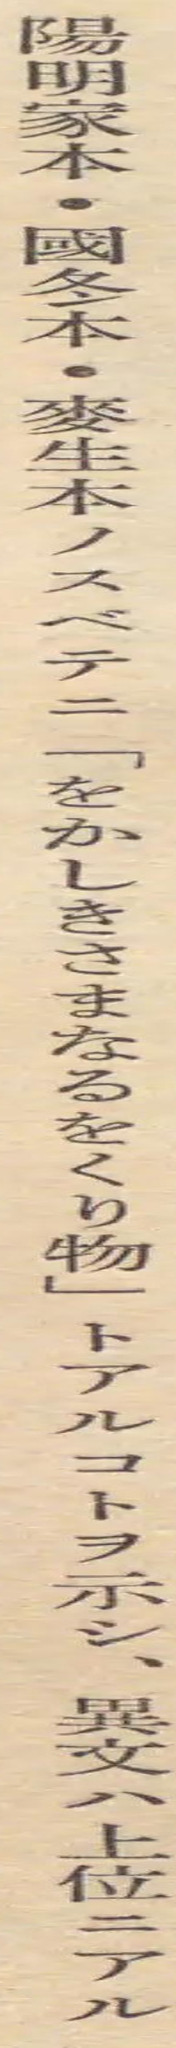陽明家本・国冬本・麦生本ノスベテニ「をかしきさまなるをくり物」トアルコトヲ示シ、異文は上位ニアル
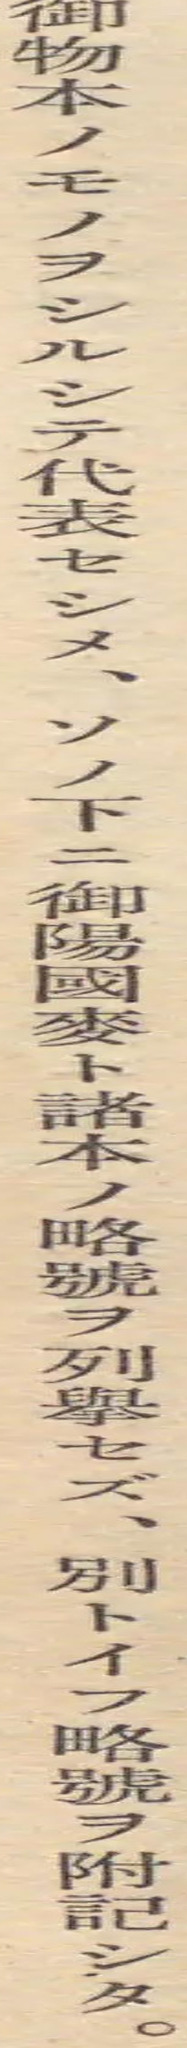御物本ノモノヲシルシテ代表セシメ、ソノ下ニ御陽国麦ト諸本ノ略号ヲ列挙セズ、別トイフ略号ヲ附記シタ。
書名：校異源氏物語.
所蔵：国立国会図書館 National Diet Library, JAPAN
